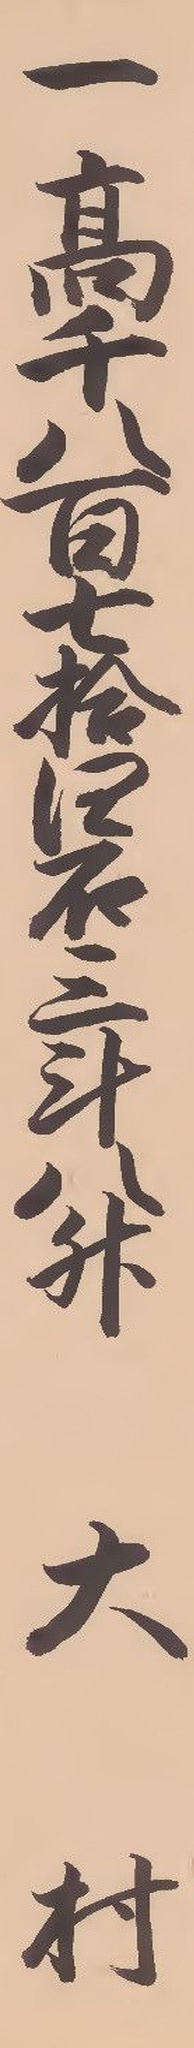一高千八百七拾四石三斗八升大村
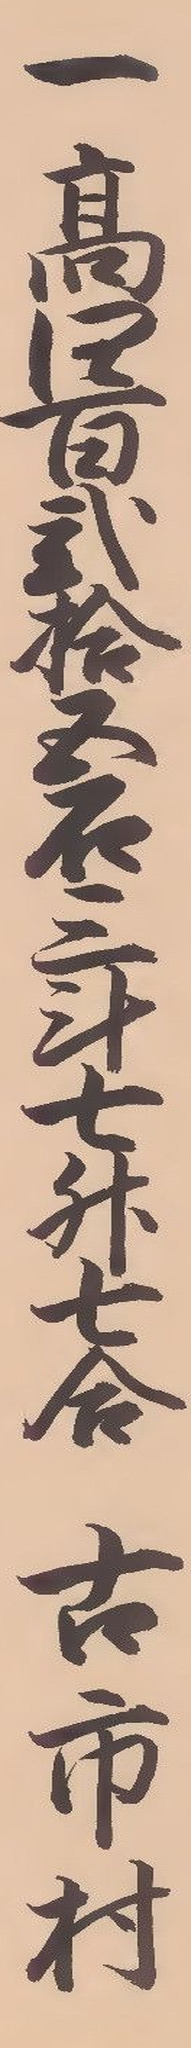一高四百弐拾五石三斗七升七合古市村
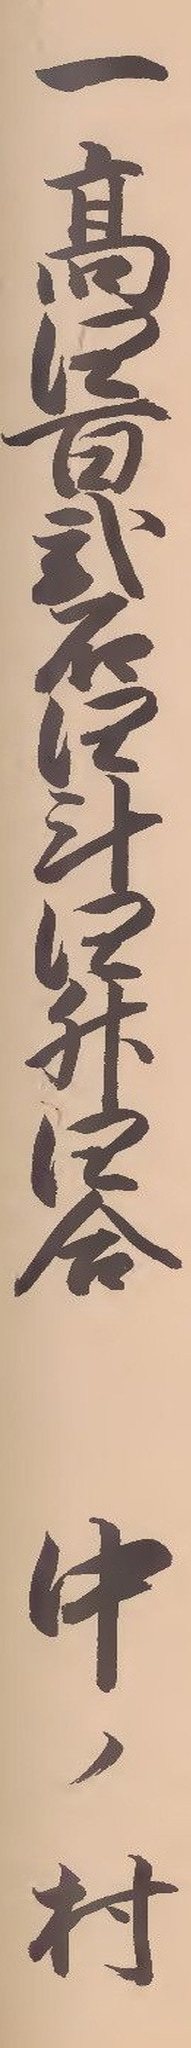一高四百弐石四斗四升四合中ノ村
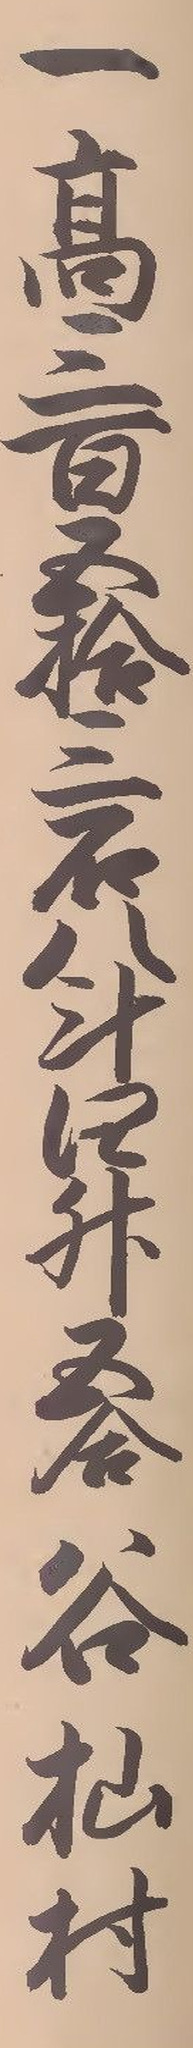一高三百五拾三石八斗四升五合谷杣村
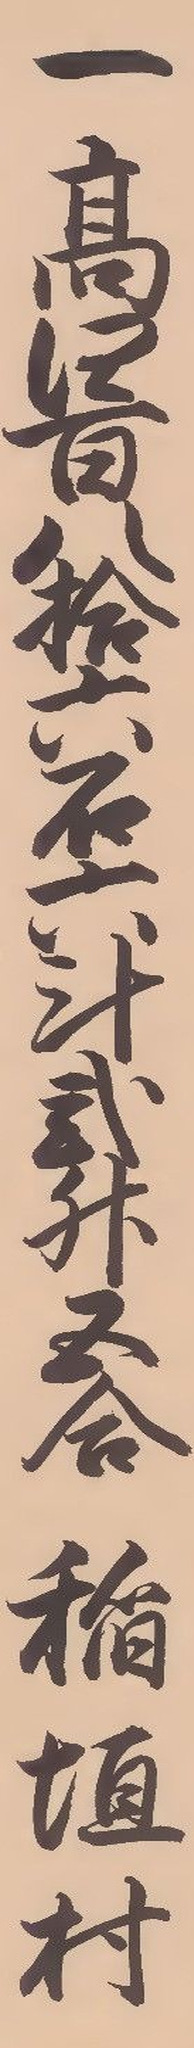一高四百八拾六石六斗弐升五合稲垣村
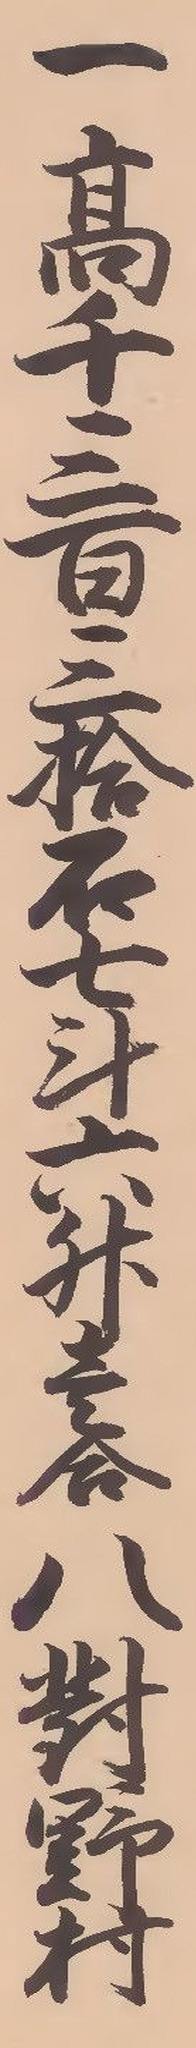一高千三百三拾石七斗六升壱合八対野村

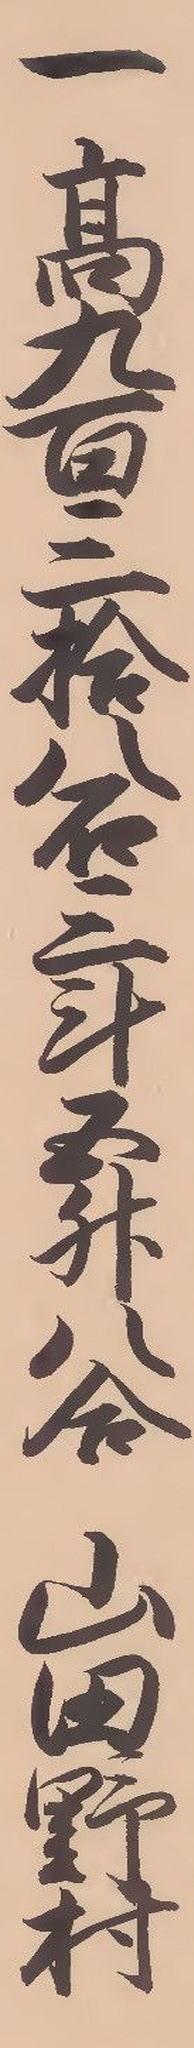一高九百三拾八石三斗五升八合山田野村
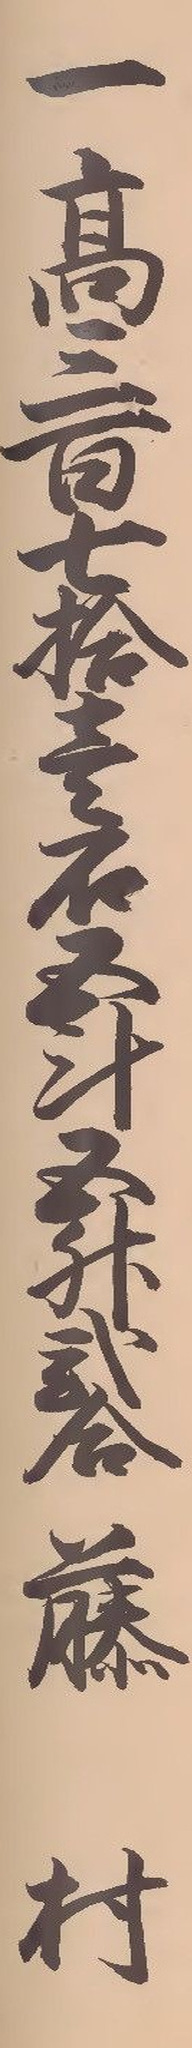一高三百七拾壱石五斗五升弐合藤村
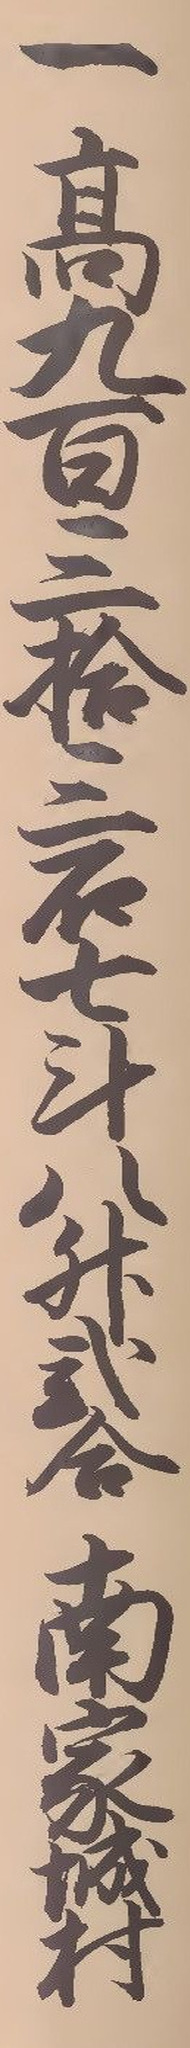一高九百三拾三石七斗八升弐合南家城村
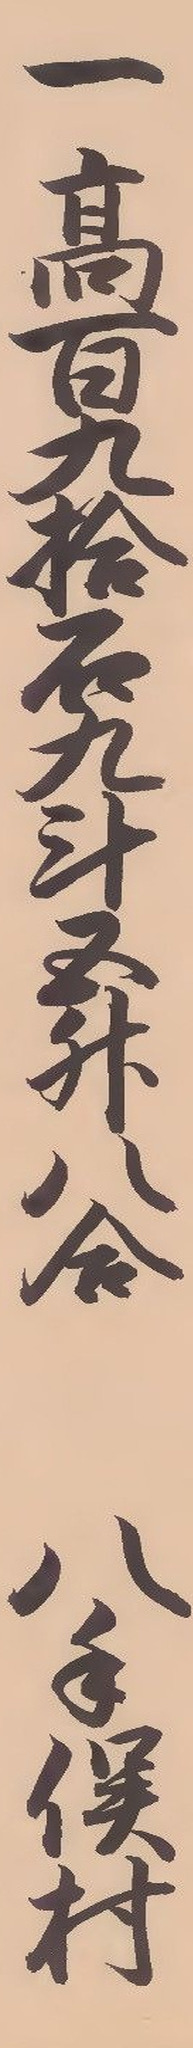一高百九拾石九斗五升八合八手俣村
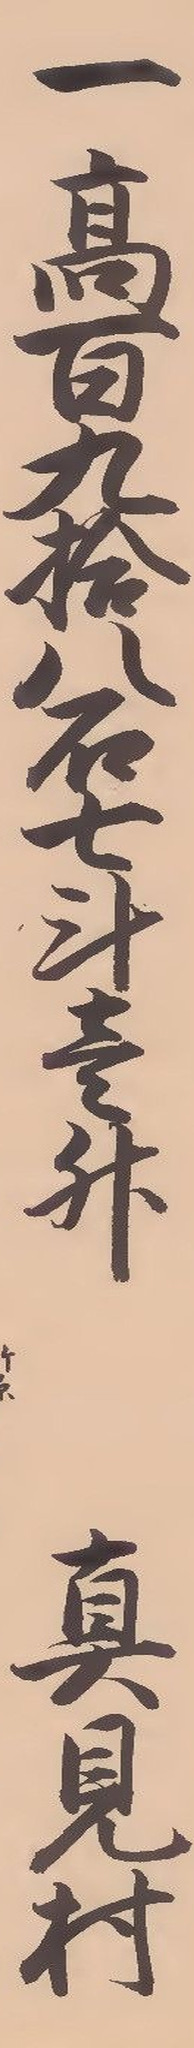一高百九拾八石七斗壱升真見村

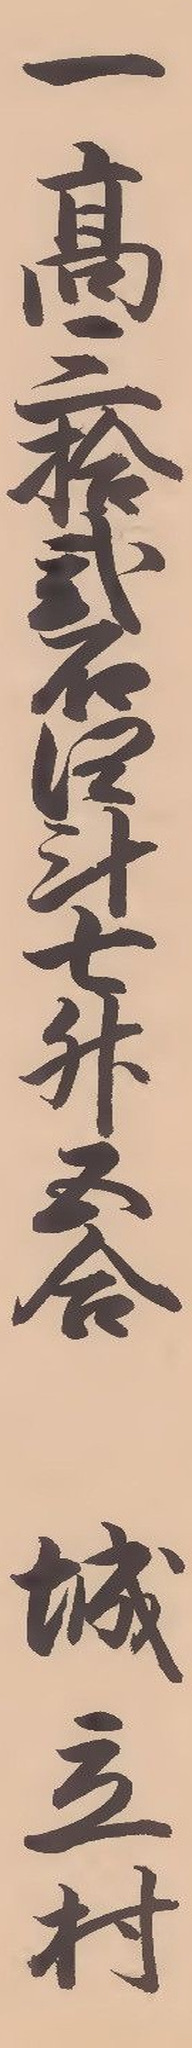一高三拾弐石四斗七升五合城立村
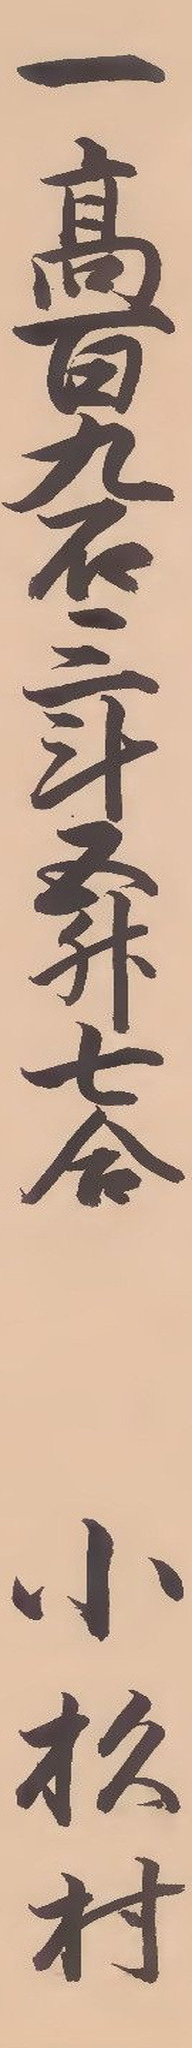一高百九石三斗五升七合小杉村
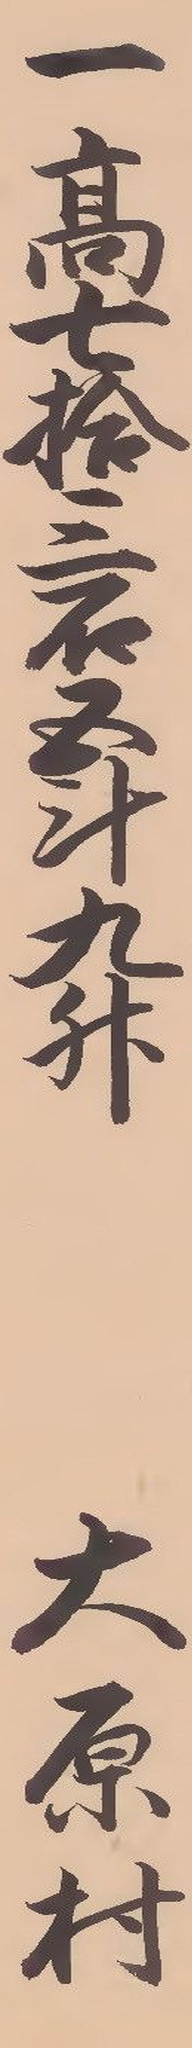一高七拾三石五斗九升大原村
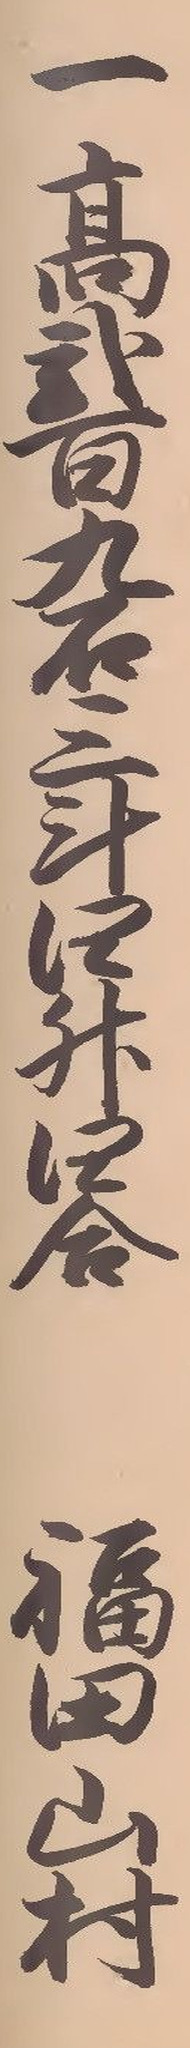一高弐百九石三斗四升四合福田山村
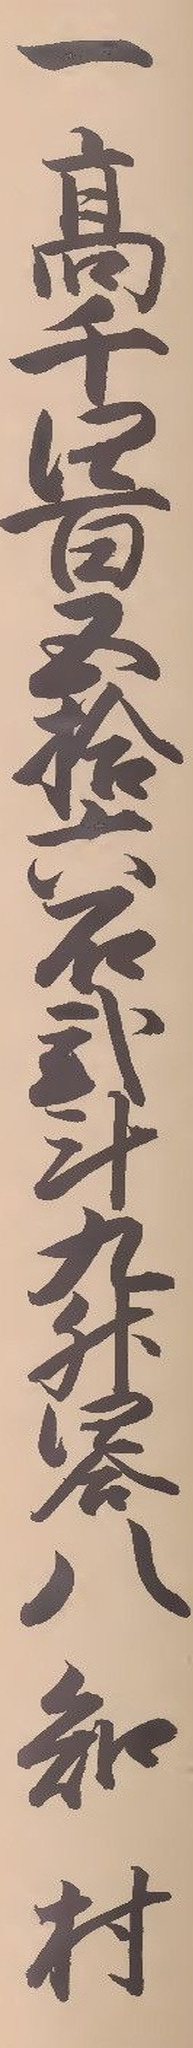一高千四百五拾六石弐斗九升四合八知村
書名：伊勢国郷帳
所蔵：国立公文書館 National Archives of Japan
